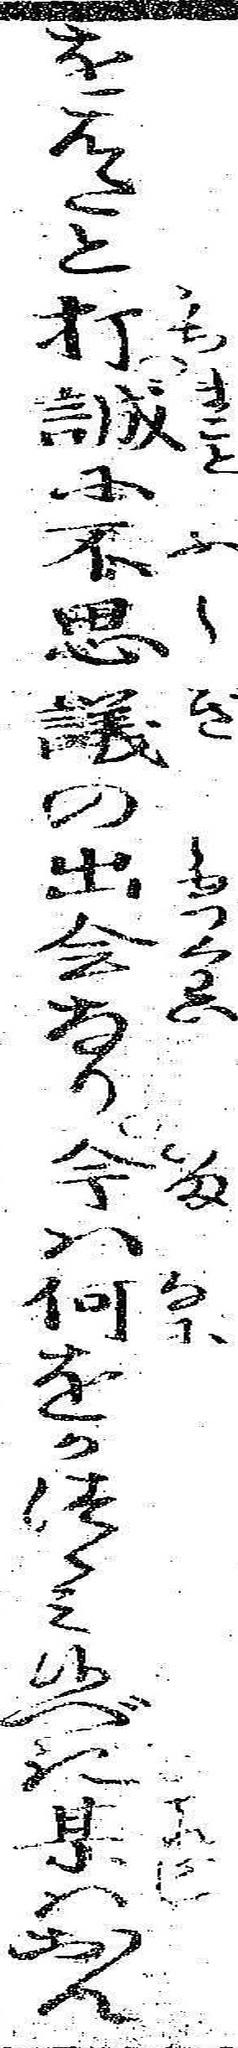をはたと打。誠に不思議の出会なり。今は何をかつゝみ候べき。某はおん
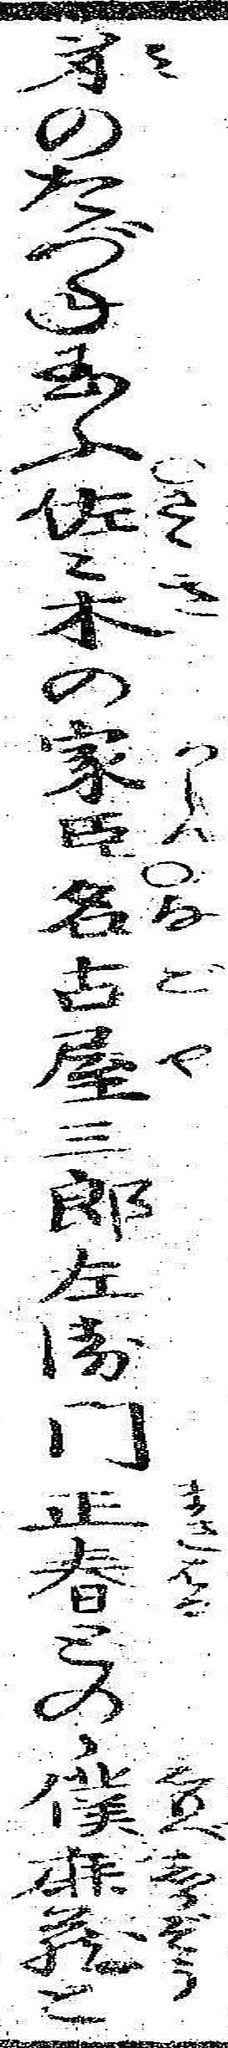身のたづね玉ふ。佐々木の家臣。名古屋三郎左衛門正春とのゝ僕鹿蔵と
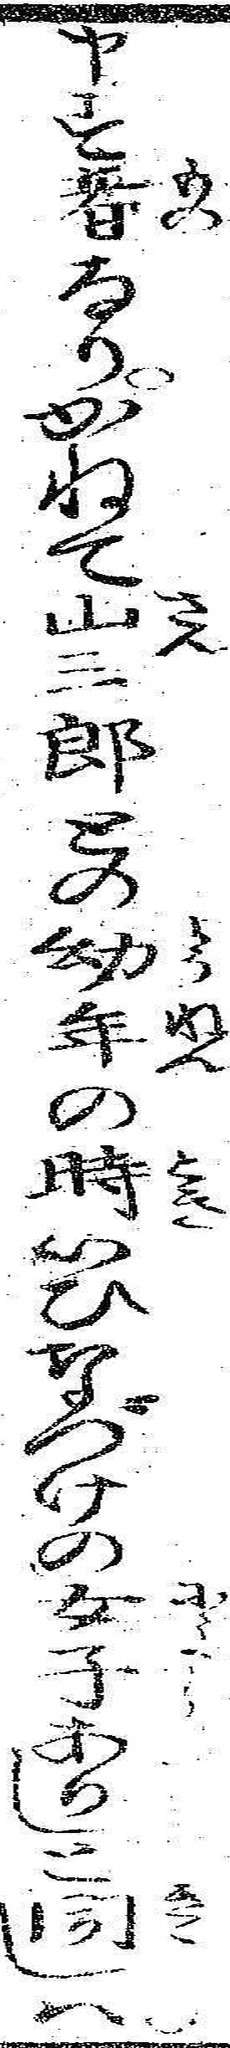申す者なり。かねて山三郎との幼年の時いひなづけの女子ありしと聞しは。
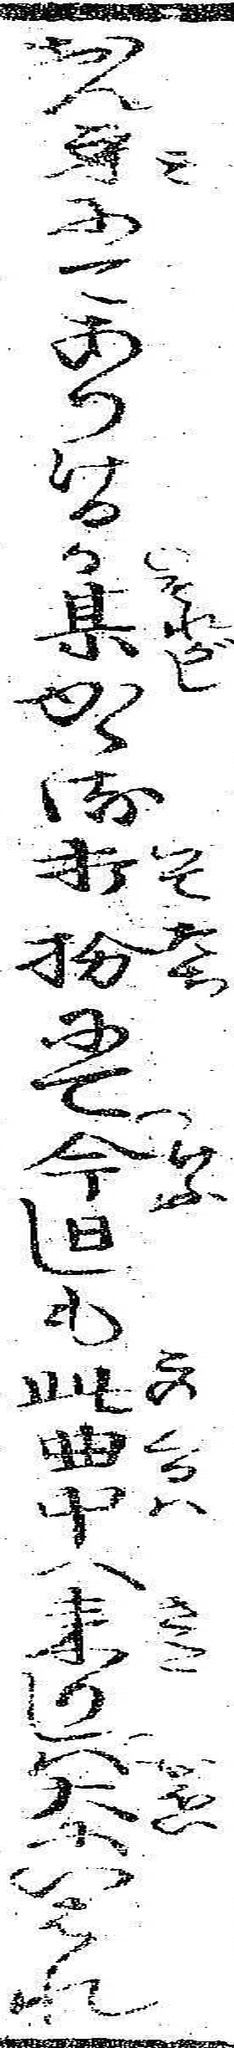おん身にてありけるか。某かゝる打扮にて。今日しも此曲中へ来りしは。大にいはれ
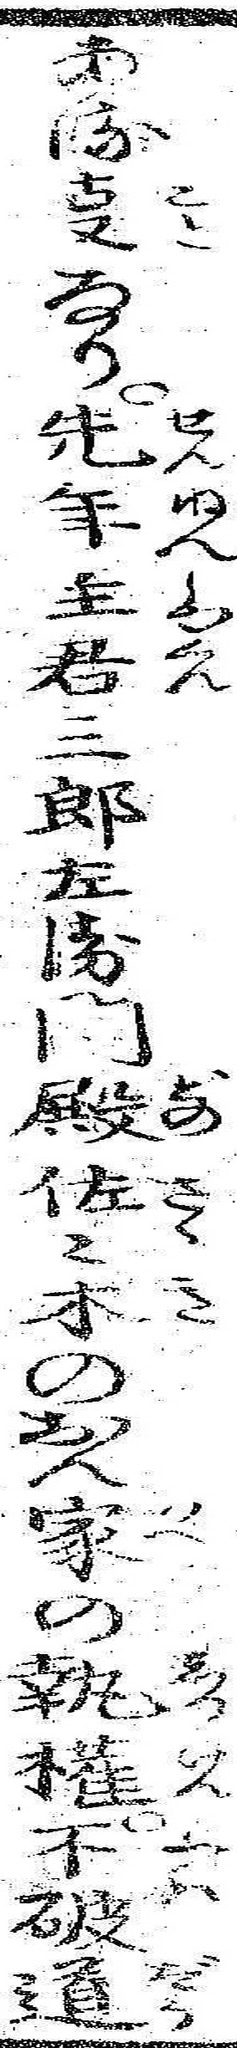ある事なり。先年主君三郎左衛門殿佐々木のおん家の執権。不破道
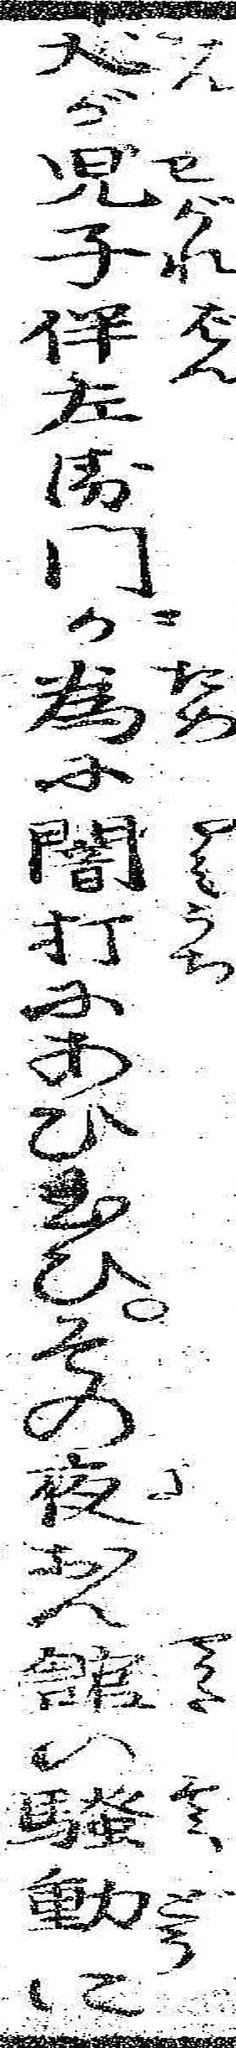犬が児子伴左衛門が為に闇打にあひ玉ひ。その夜おん館の騒動に
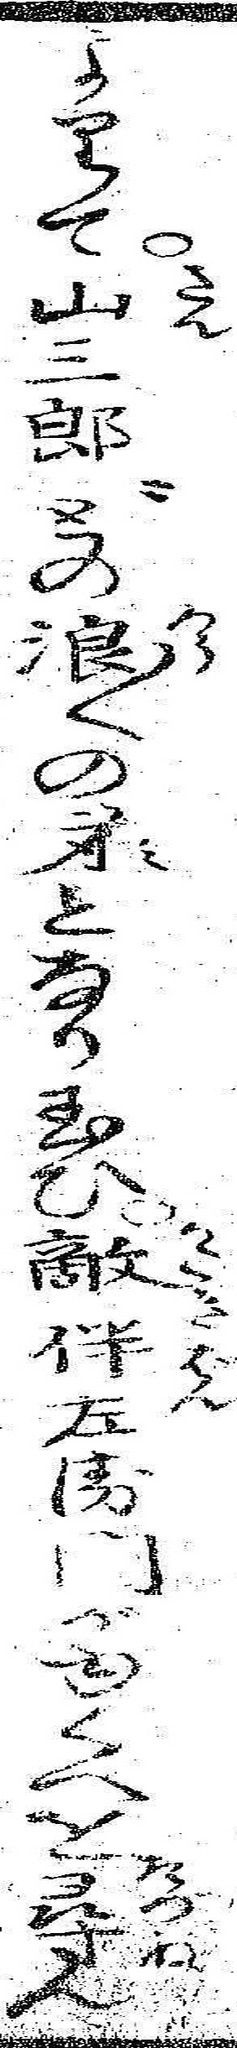よりて。山三郎どの浪の身となり玉ひ。敵伴左衛門がゆくへを尋ん
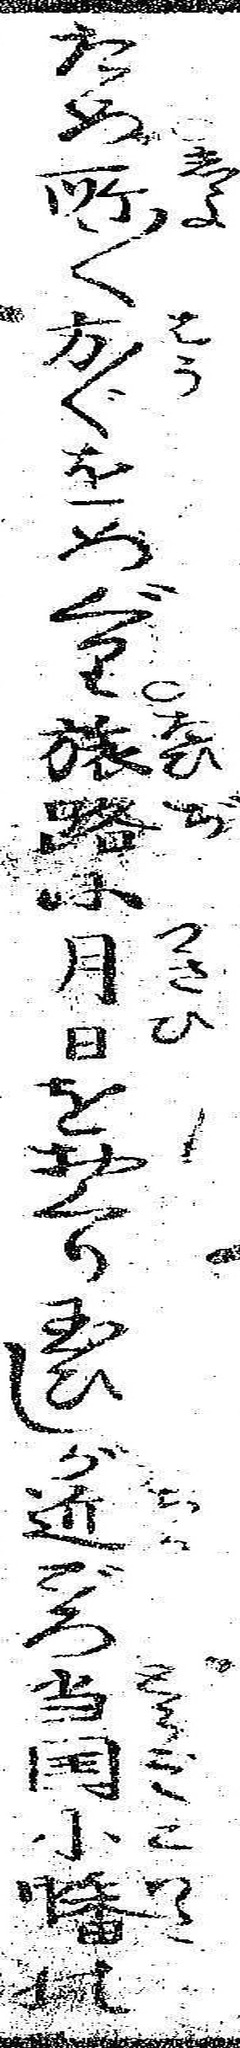ため所方をめぐり。旅路に月日をおくり玉ひしが。近ごろ当国小幡の
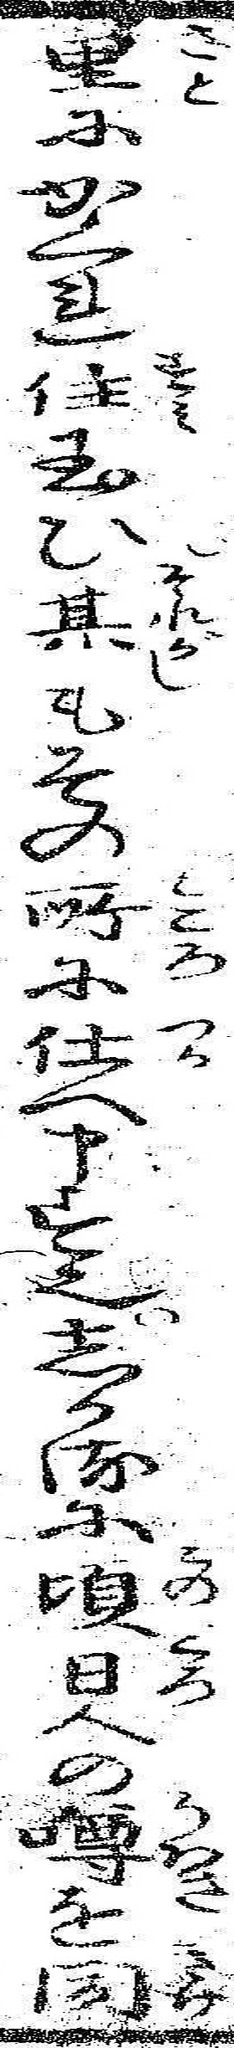里にかくれ住玉ひ。某もその所に仕へ申す也。しかるに頃日人の噂を聞

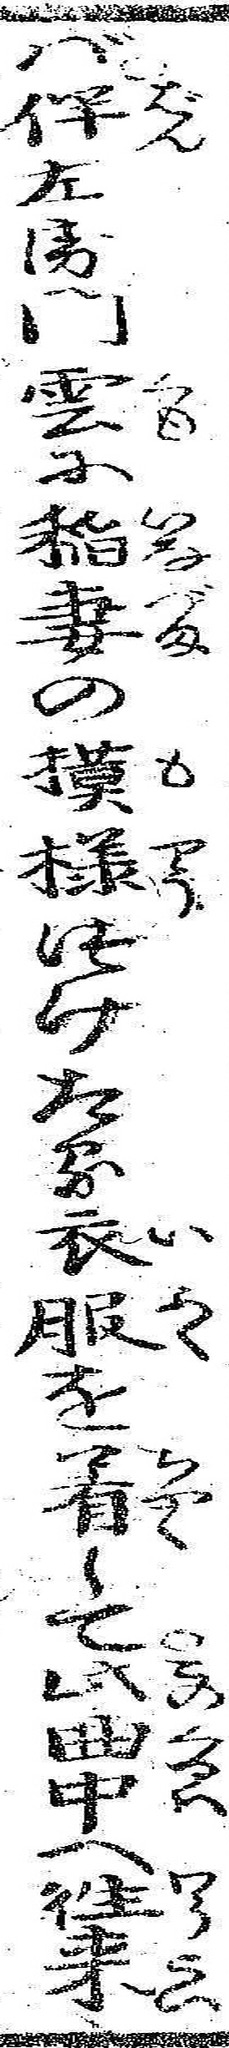ば。伴左衛門雲に稲妻の模様つけたる衣服を着して。此曲中へ往来
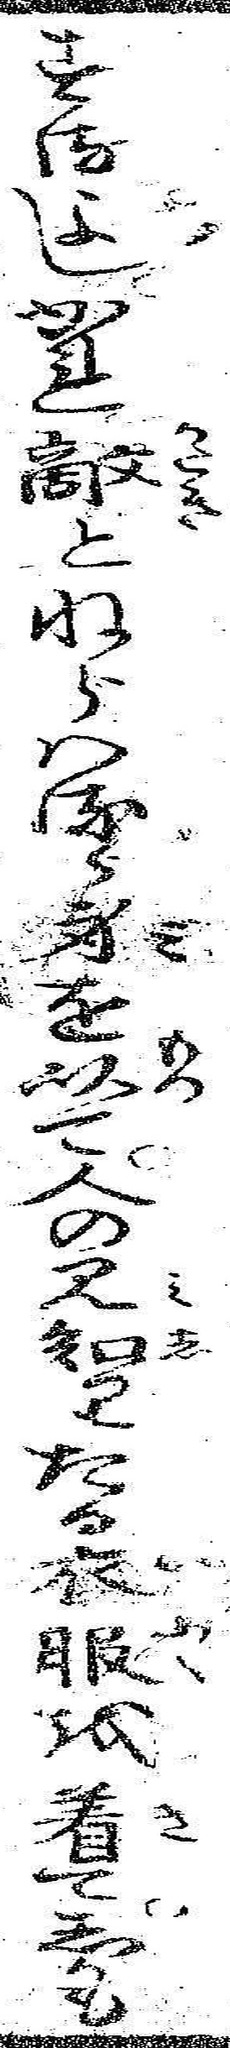するよし。かれ敵とねらはるゝ身を以て。人の見知りたる衣服を着て。しかも
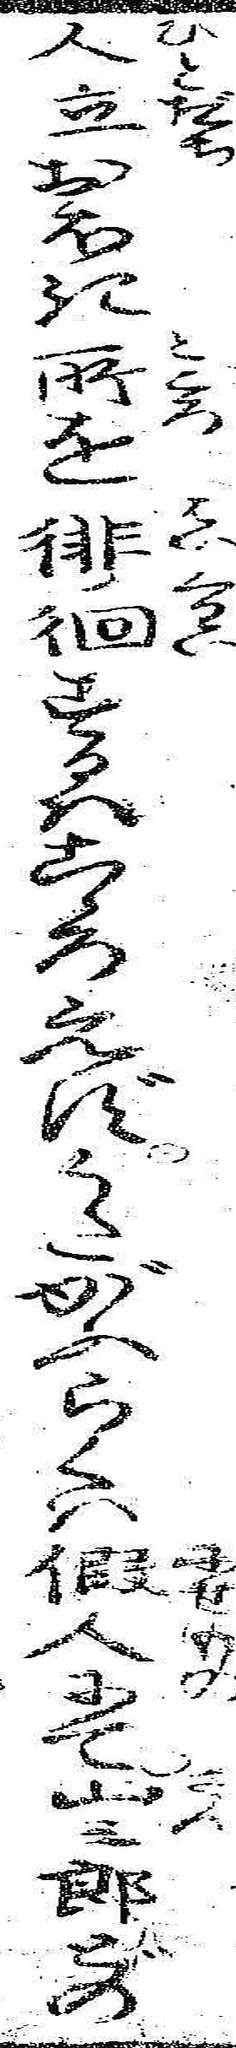人立おほき所を俳徊するはこゝろえず。うたがふらくは仮人にて。山三郎どの
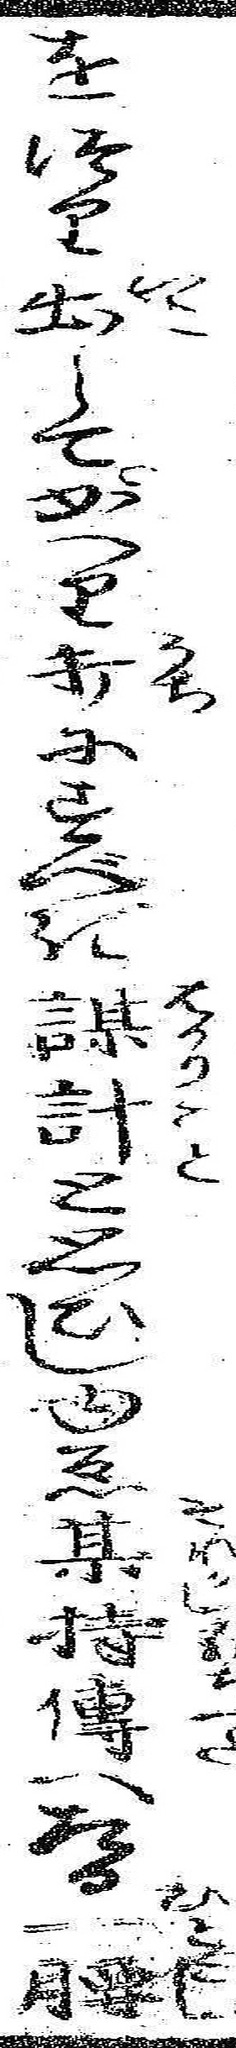をつり出して。かへり打にすべき謀計と思ひしゆゑ某持伝へたる一腰
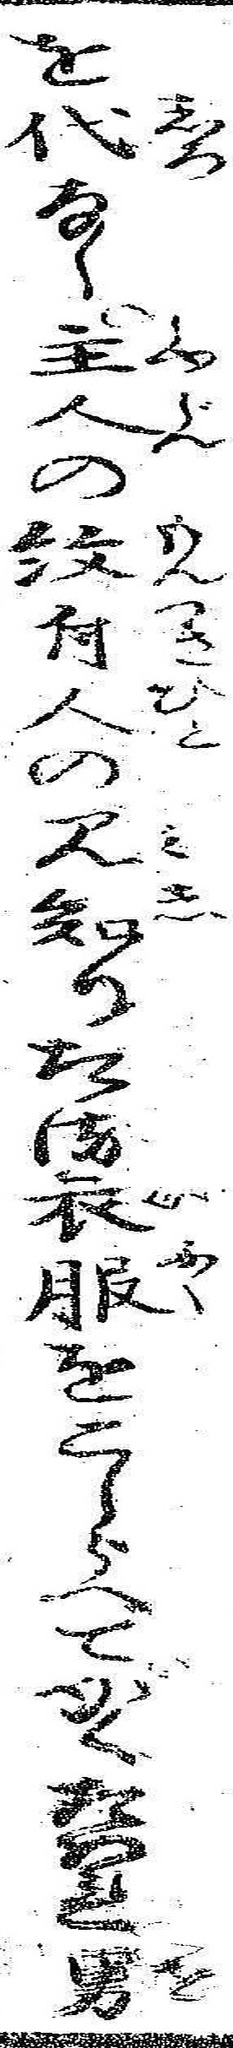を代なし。主人の紋付人の見知りたる衣服をこしらへて。かくたはれ男
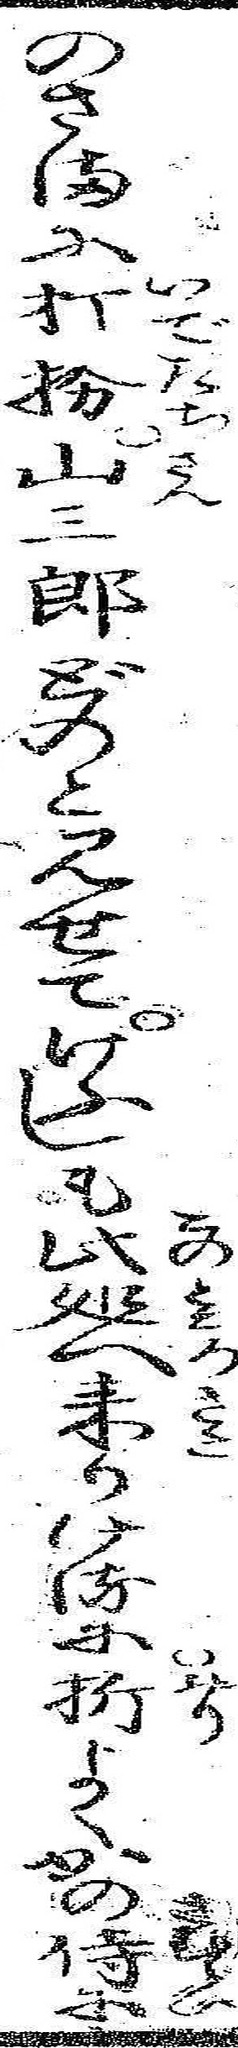のさまに打扮。山三郎どのと見せて。けふしも此処へ来りけるに。折よくかの侍に
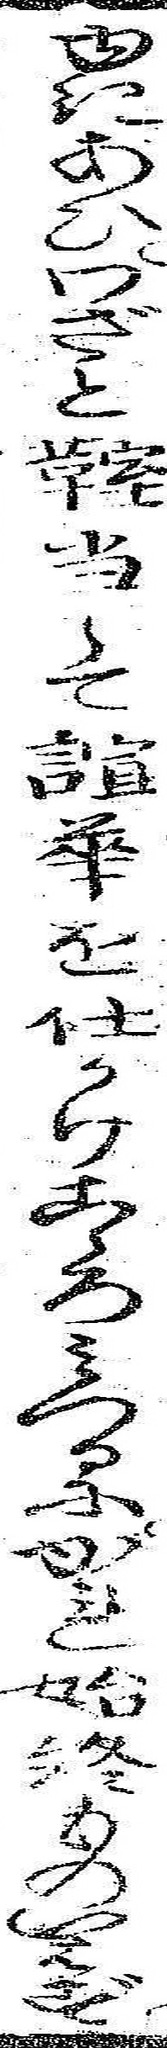ゆきあひ。わざと鞘当して諠華を仕かけこゝろみつるに。かれ始終ものいはず。
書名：昔話稲妻表紙
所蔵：国文学研究資料館
